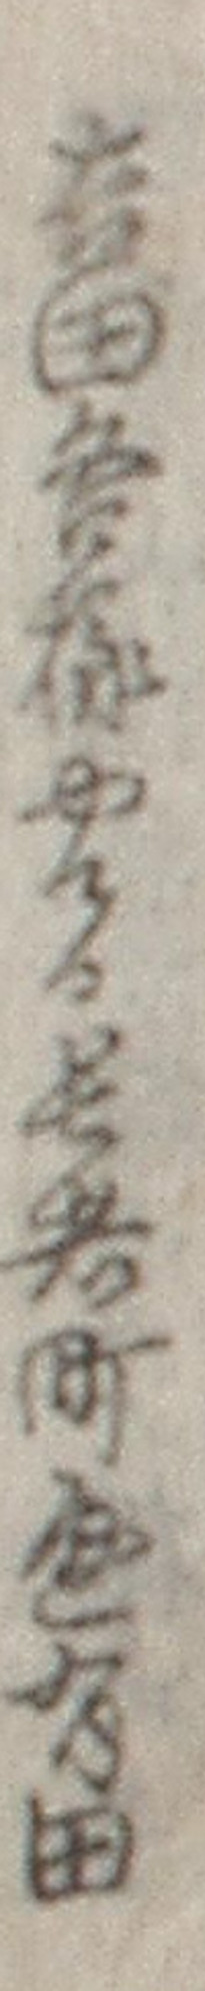吉田各様やける長者町通り有田

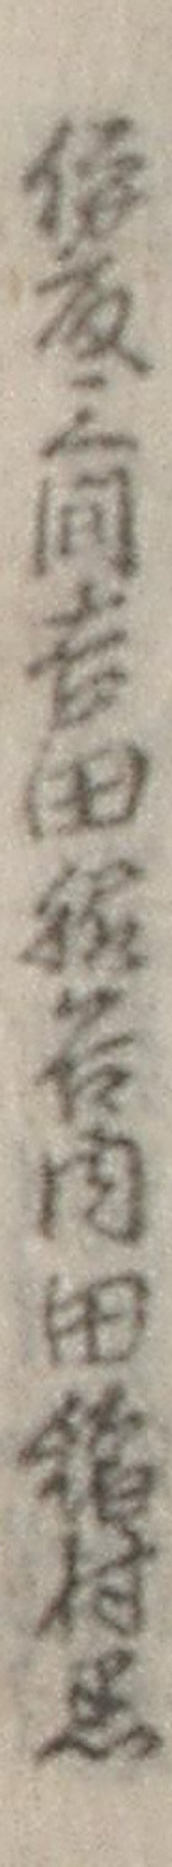伊藤三間吉田脇谷内田稲村黒
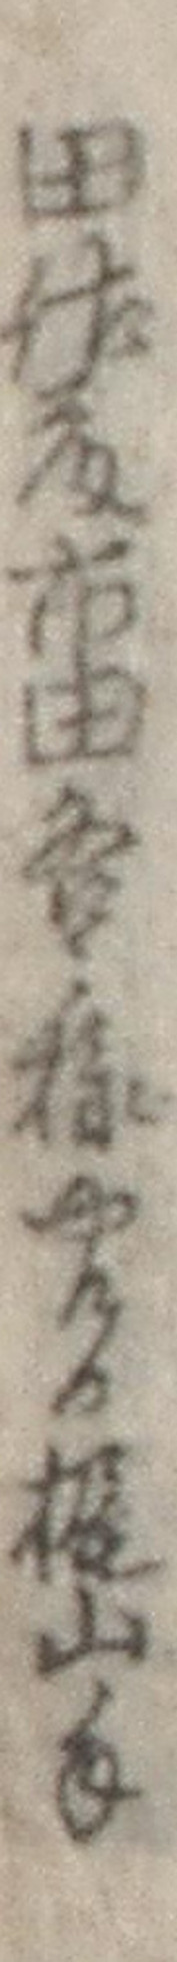田佐藤市田各様やける梶山手
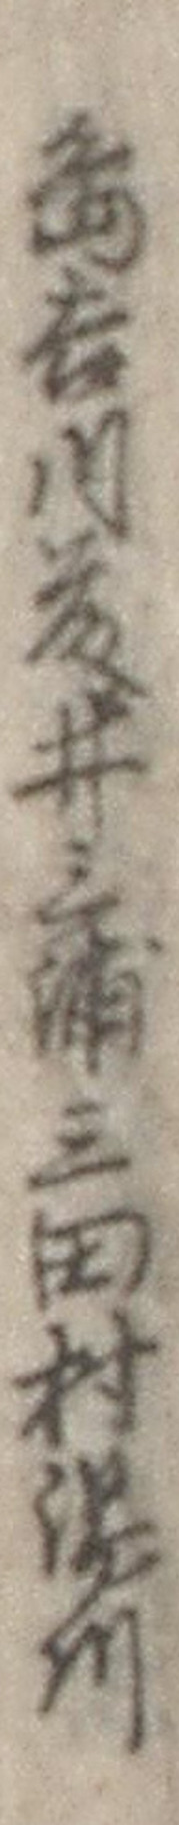島吉川藤井三浦三田村湯川
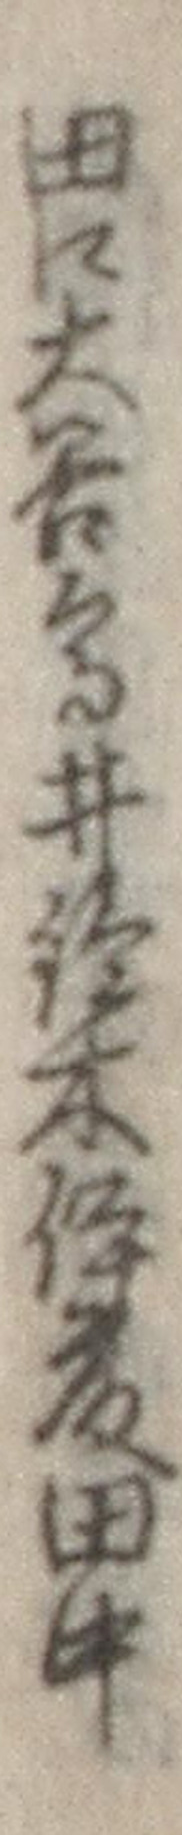田口大谷鳥井鈴木伊藤田中
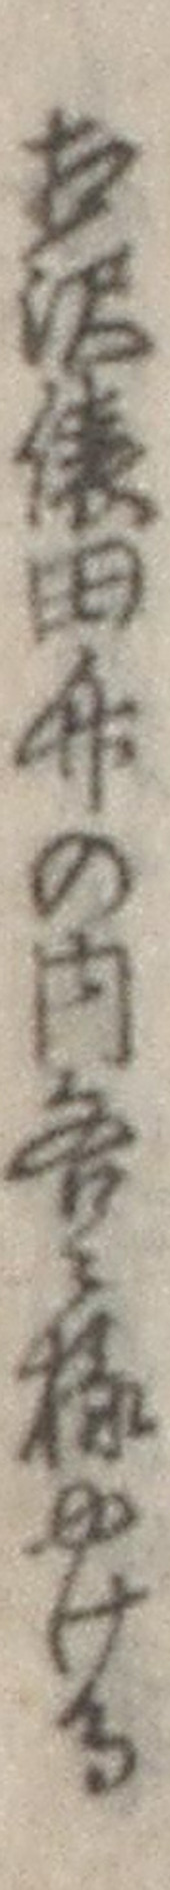相沢俵田竹の内各〻様やける
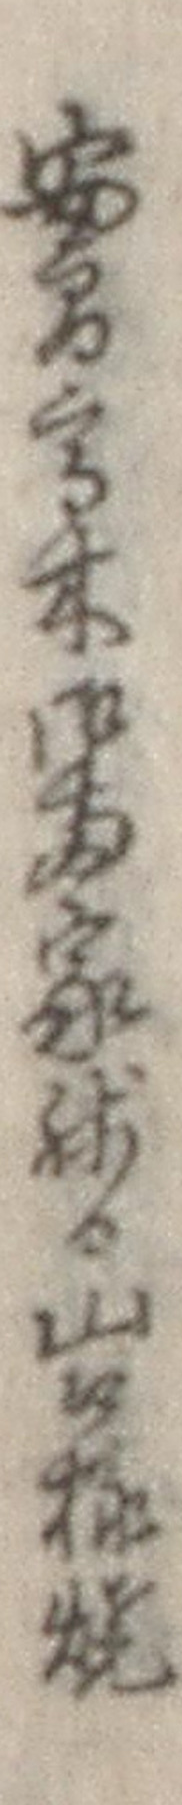安間高木御両家残る山口様焼
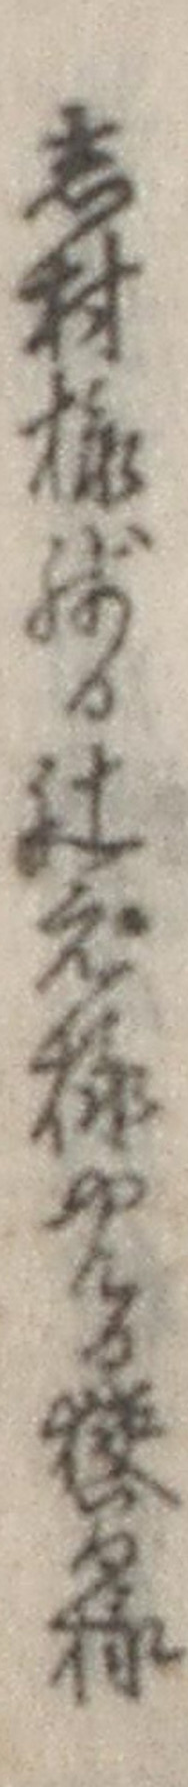岩村様残る辻本様やける狭間様
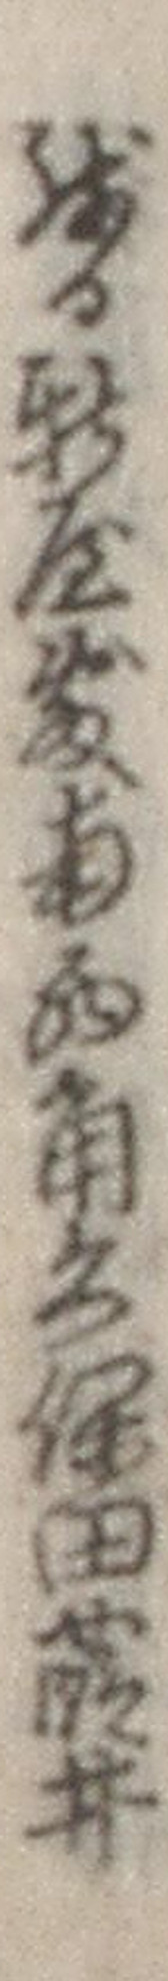残る新屋敷南西角久保田藤井
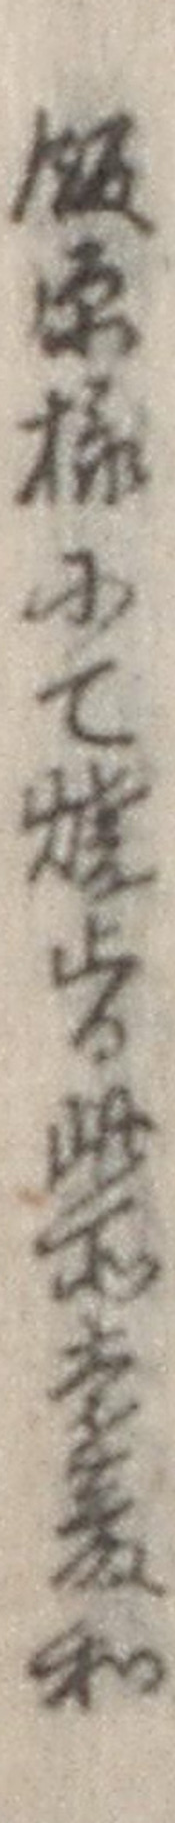飯原様にて焼止る此所遠藤和
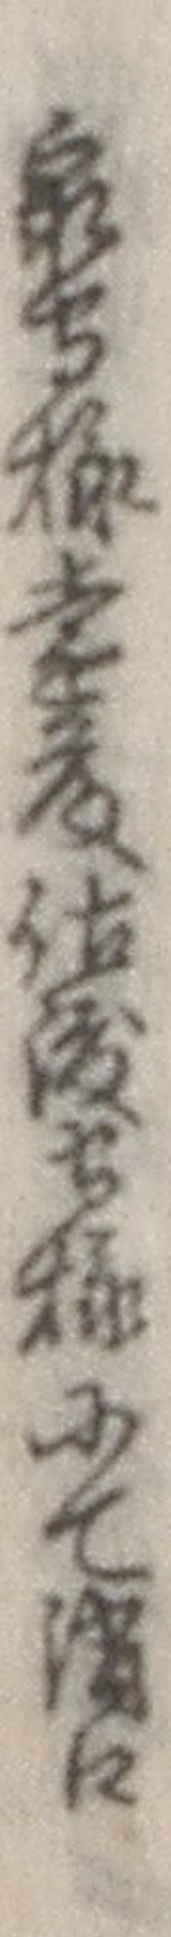泉守様遠藤佐渡守様にて消口
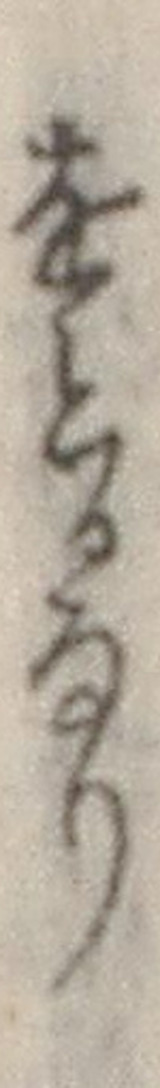をとるなり
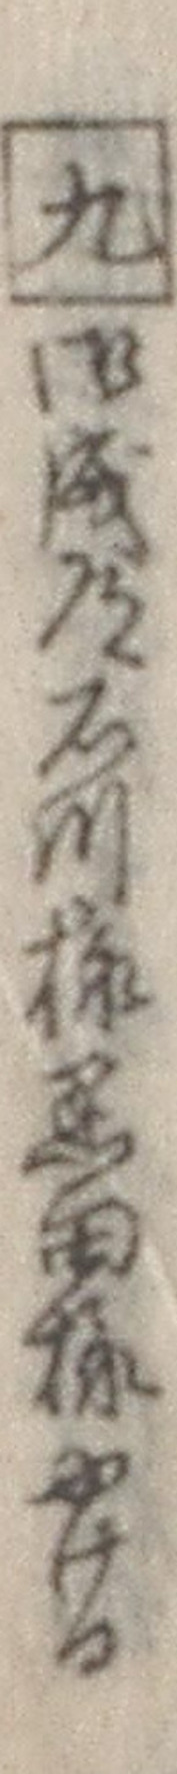九御成道石川様黒田様やける
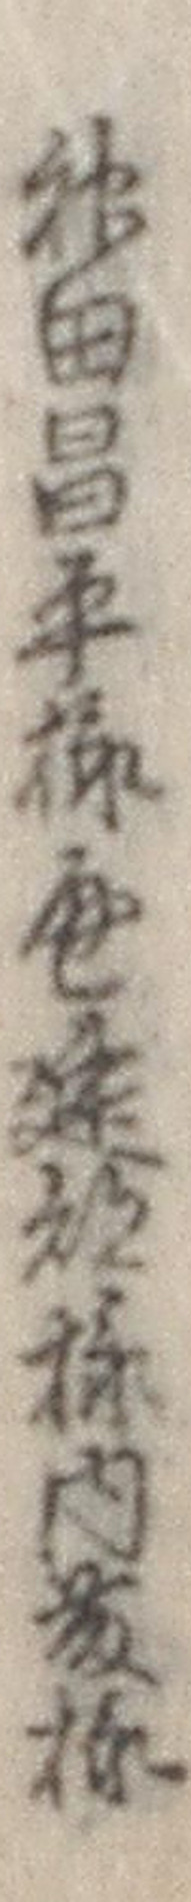神田昌平様安達部様内藤様
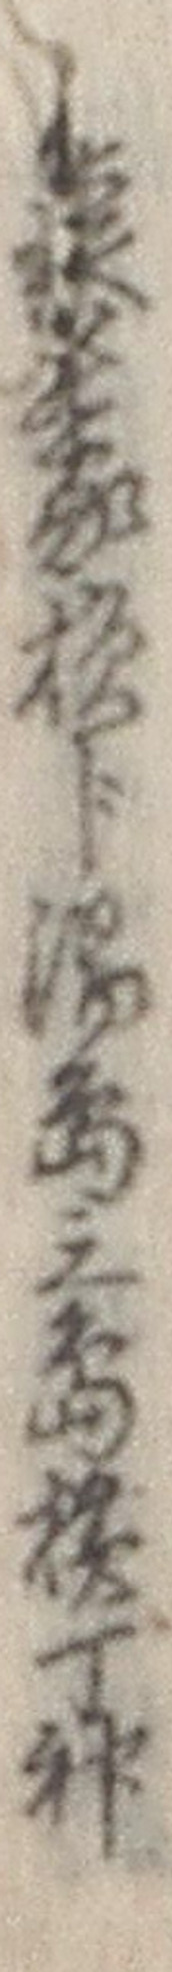藤堂家損じ湯島三島横丁神
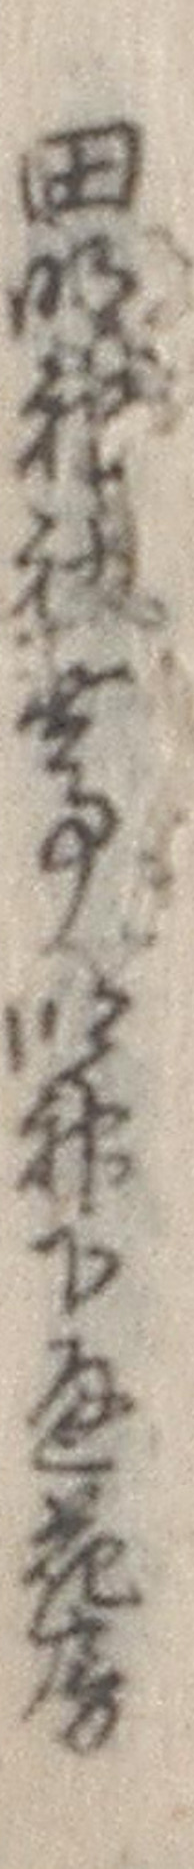田明神無事御神下通花房
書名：江戸　大地震臣細録　全
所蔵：東京大学地震研究所図書室 Earthquake Research Institute Library, The University of Tokyo, JAPAN
